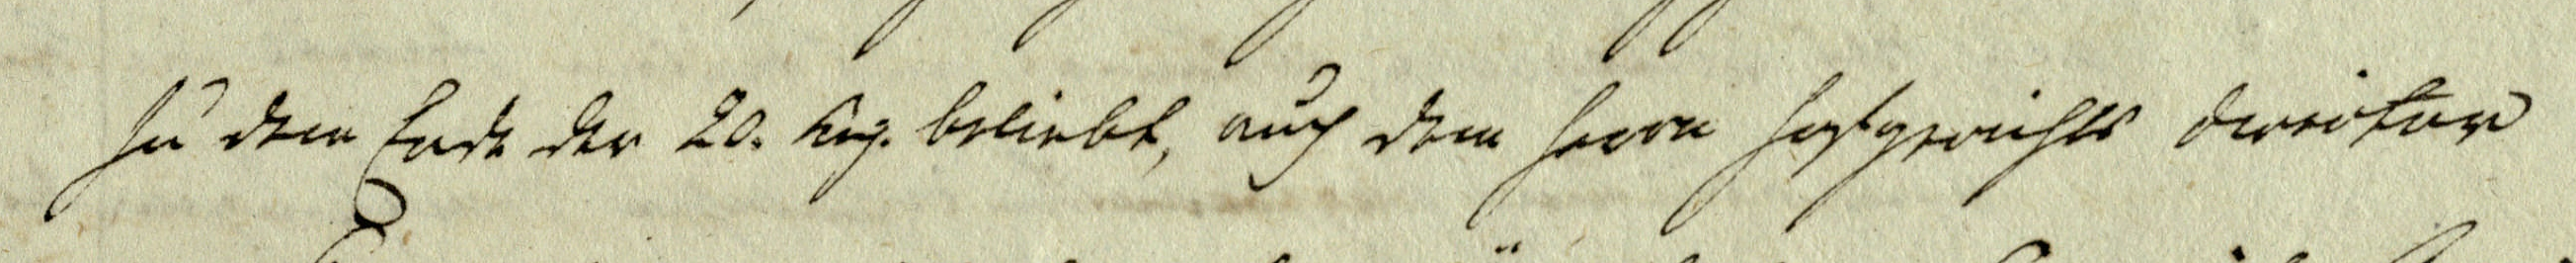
zu dem Ende der 20. huj. beliebt, auch dem Herrn Hofgerichts Director
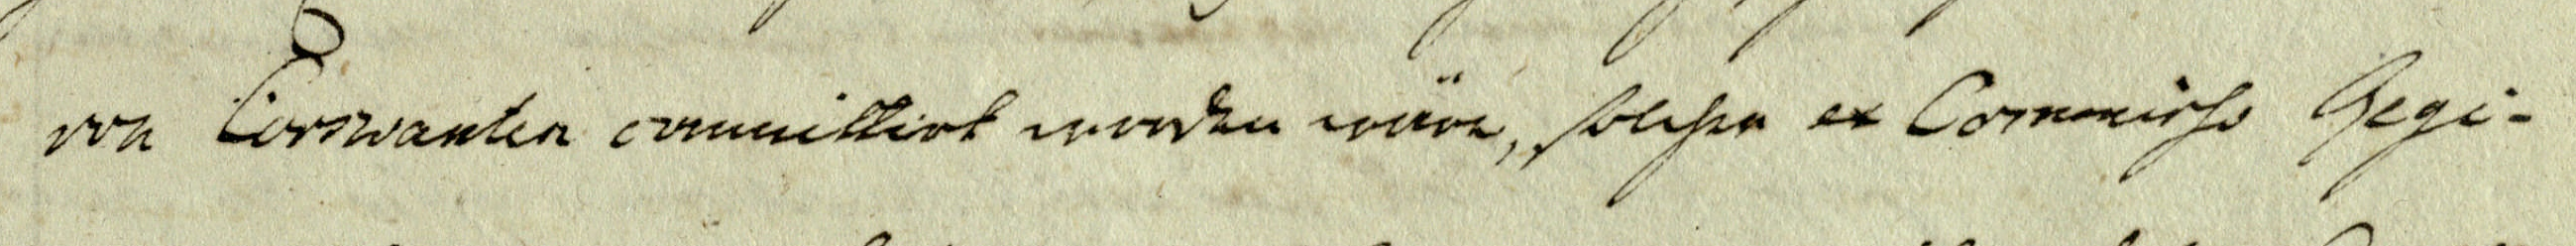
von Corswanten committirt worden wäre, solcher ex Commisso Regi¬
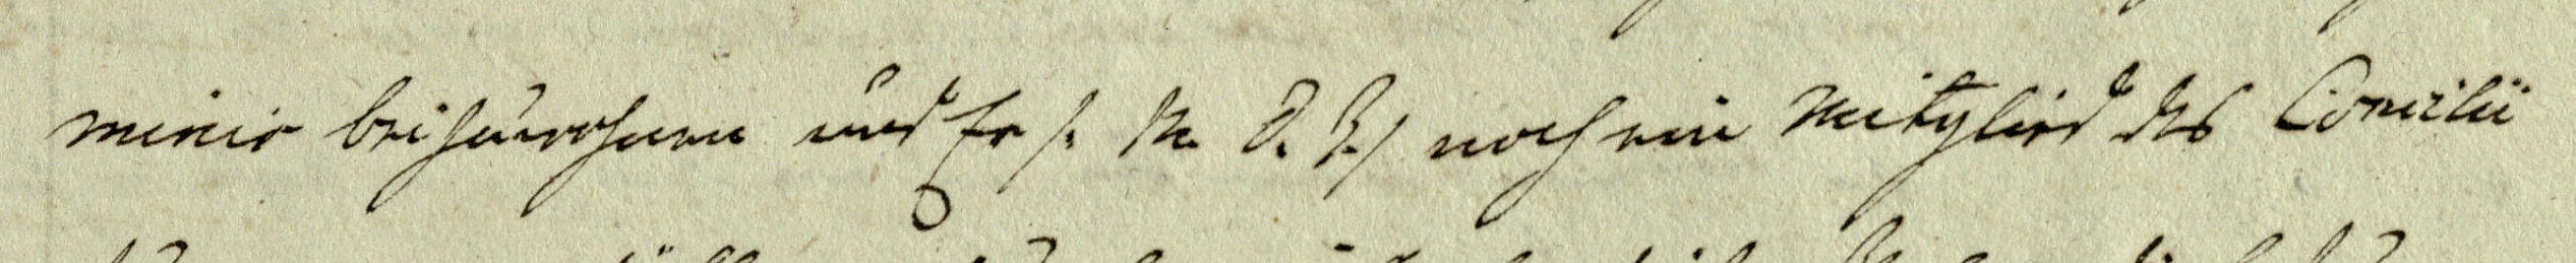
minis beizuwohnen und Er /. M. D. R./ noch ein Mitglied des Concilii
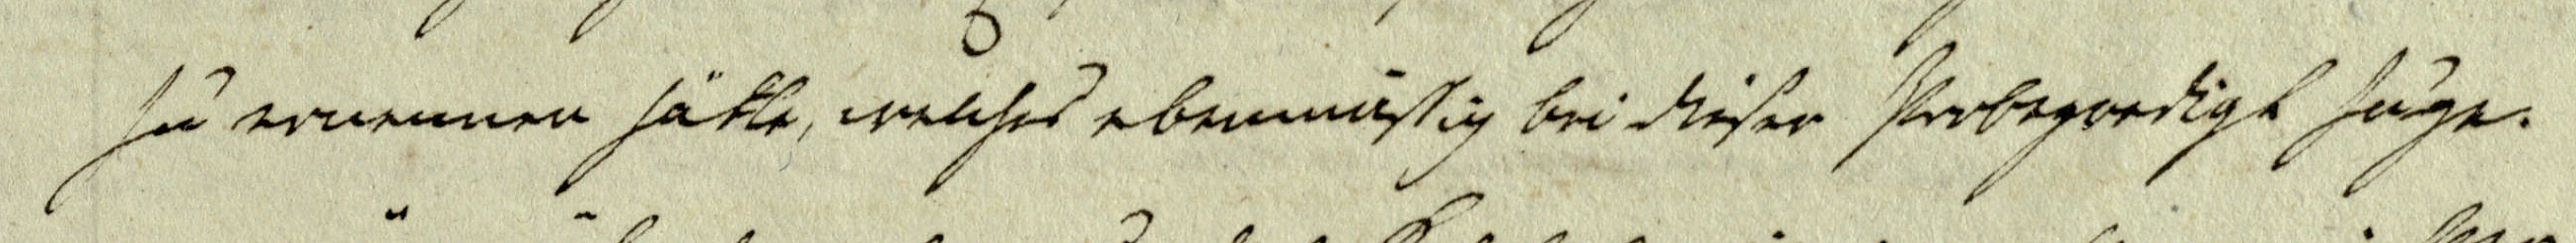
zu ernennen hätte, welches ebenmässig bei dieser Probepredigt zuge¬
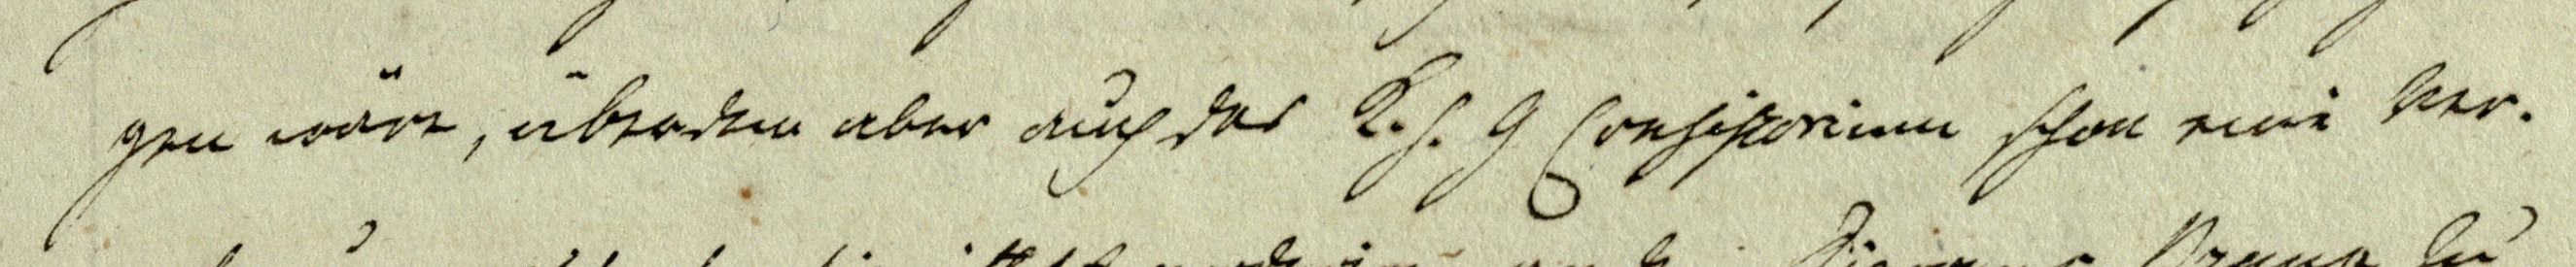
gen wäre, überdem aber auch das K. h. G Consistorium schon eine Ver¬
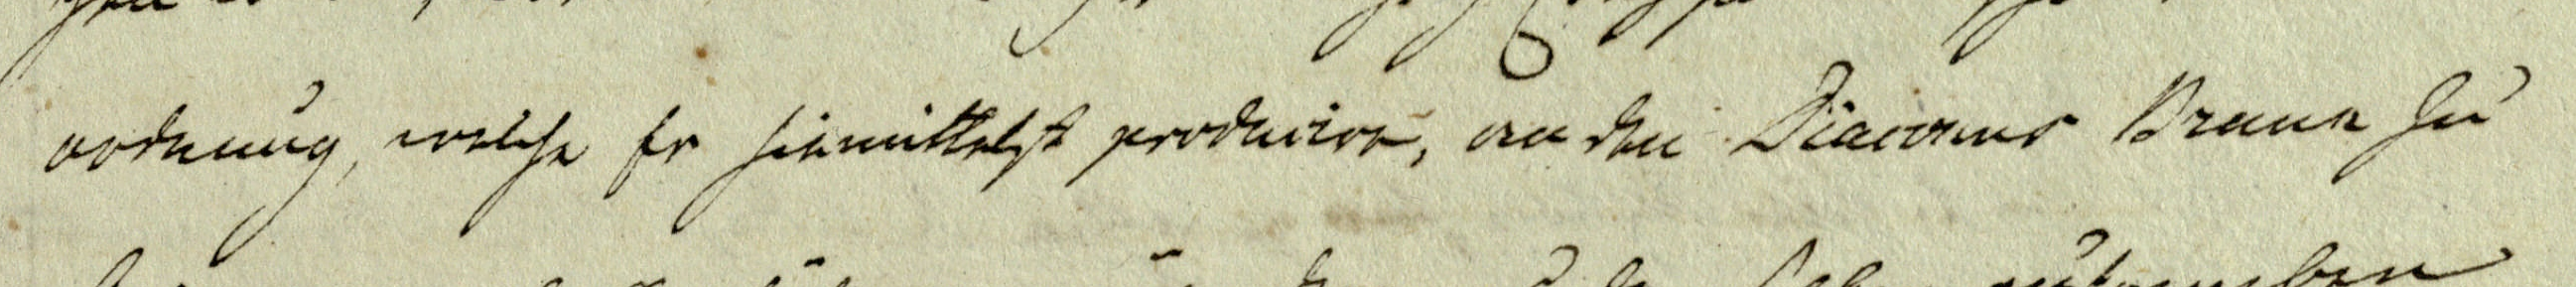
ordnung, welche Er hiemittelst producire, an den Diaconus Braun zu
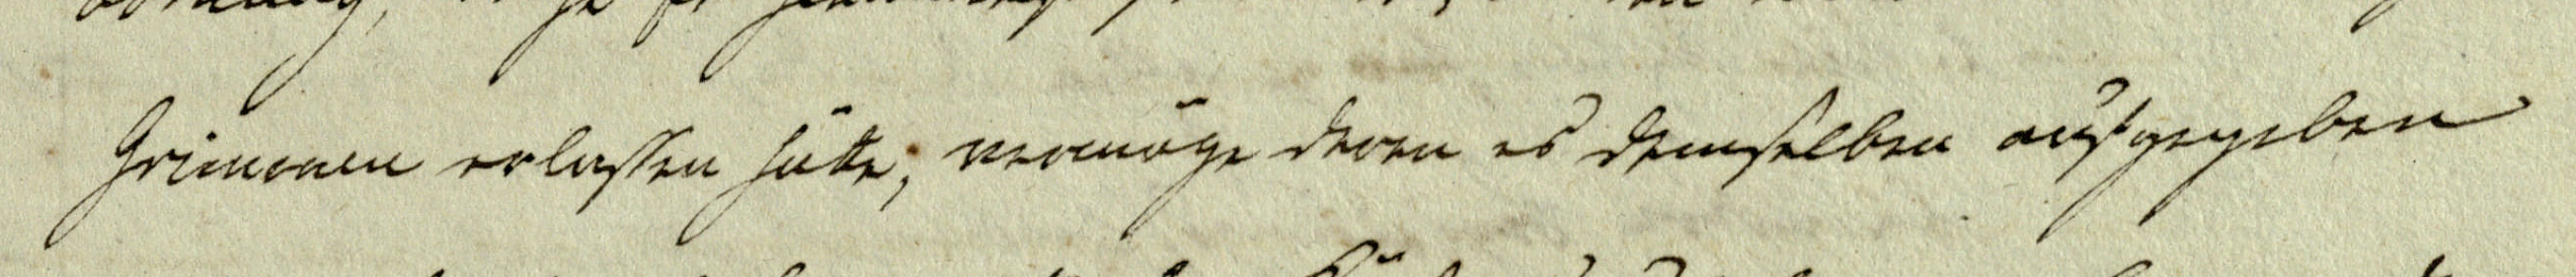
Grimmen erlassen habe; vermöge deren es demselben aufgegeben
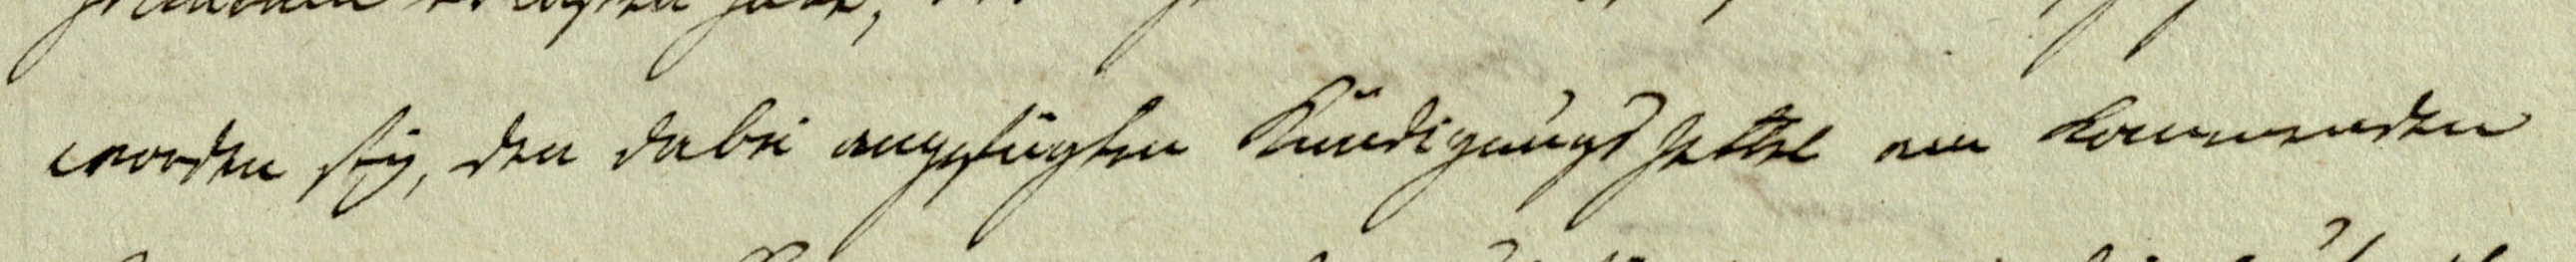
worden seÿ, den dabei angefügten Kündigungs Zettel am kommenden
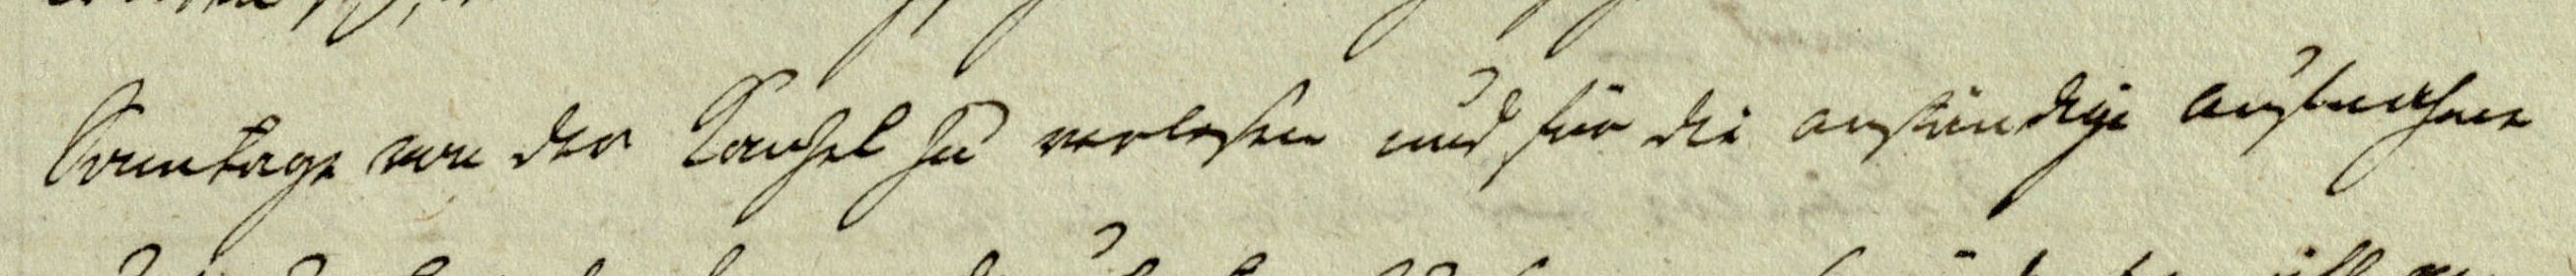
Sonntage von der Kanzel zu verlesen und für die anständige Aufnahme
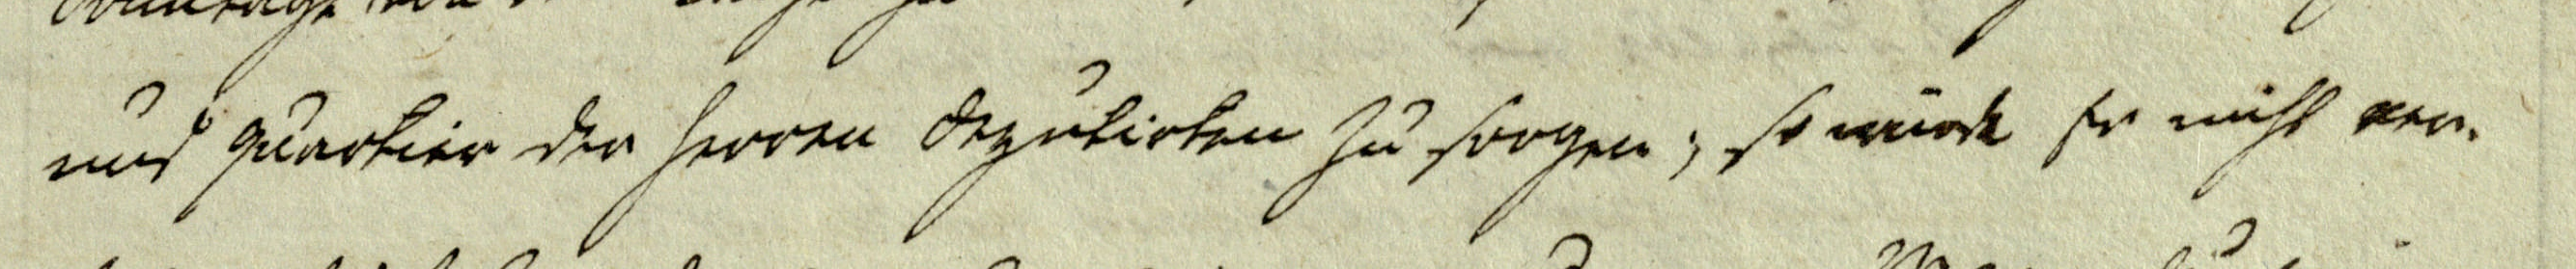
und Quartier der Herren Deputirten zu sorgen; so würde Er nicht ver¬
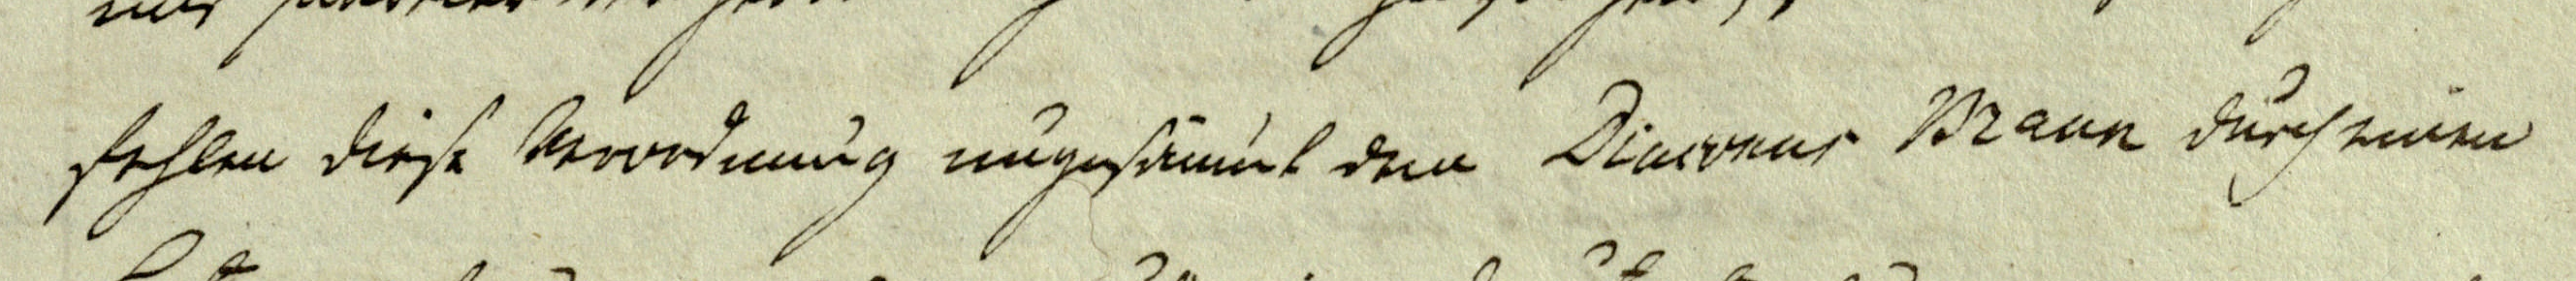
fehlen diese Verordnung ungesäumt dem Diaconus Braun durch einen
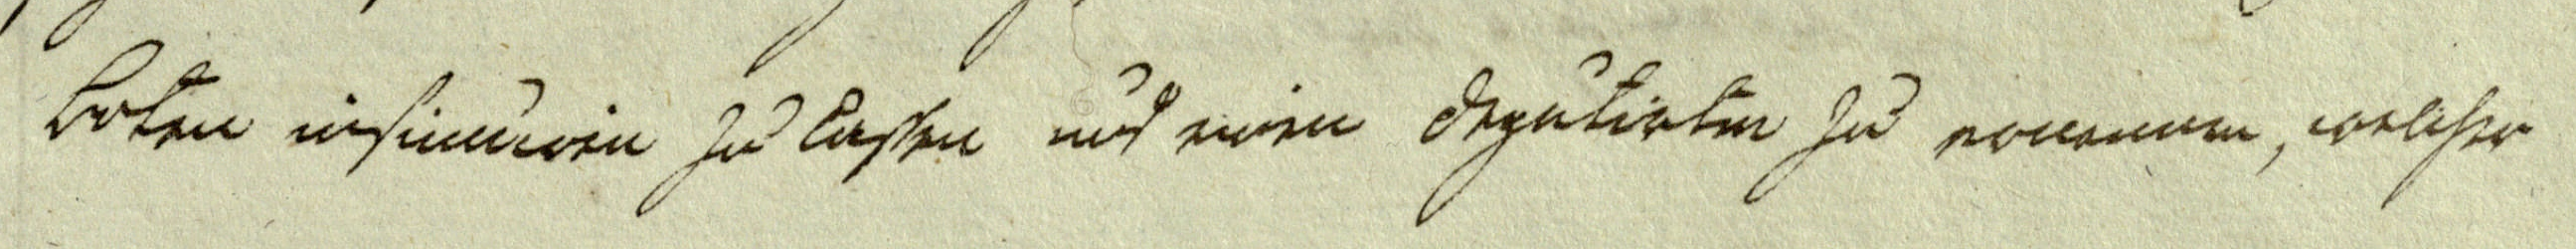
Boten insinuiren zu lassen und einen Deputirten zu ernennen, welcher
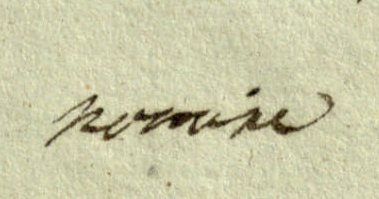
nomine
